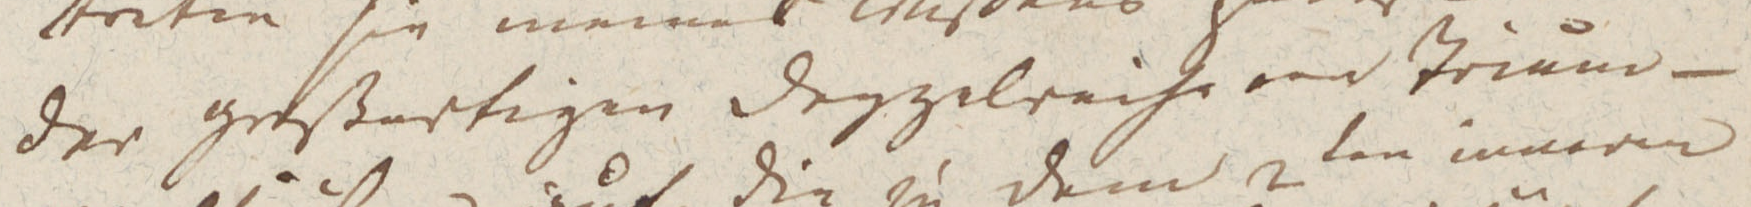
der grossartigen Doppelreihe von Trium-
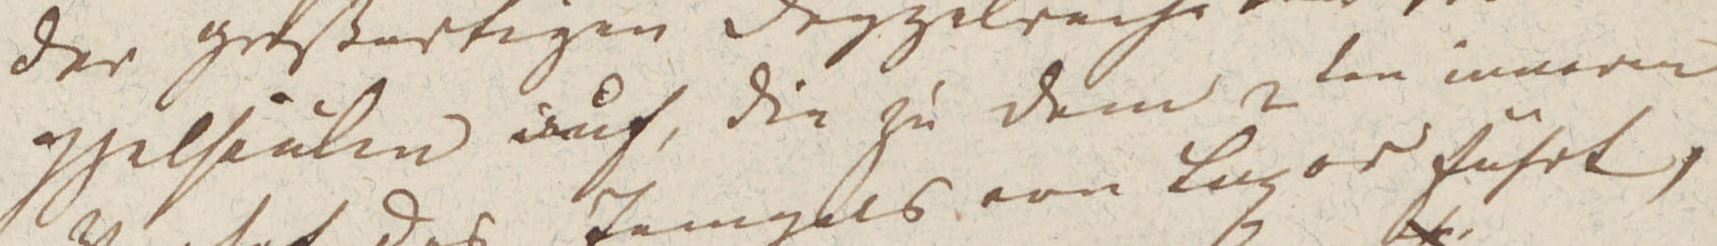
phalsäulen uauf, die zu dem 2ten inneren
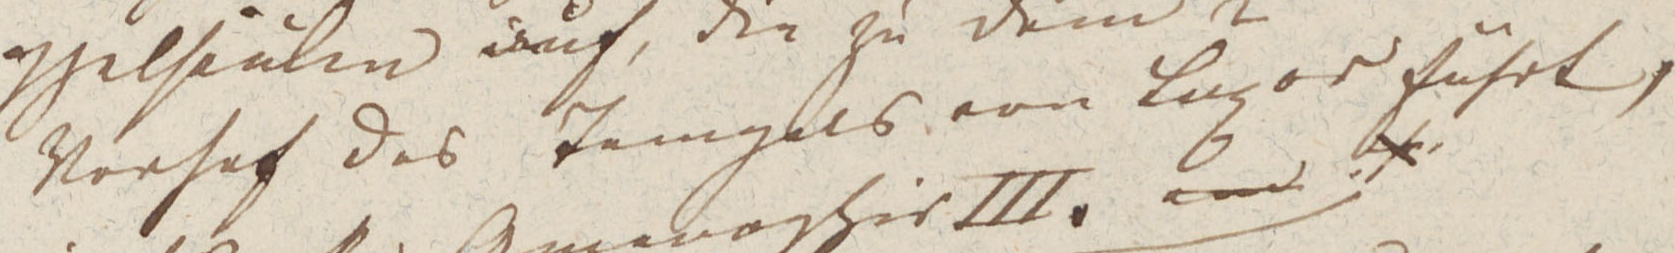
Vorhof des Tempels von Luxor führt,
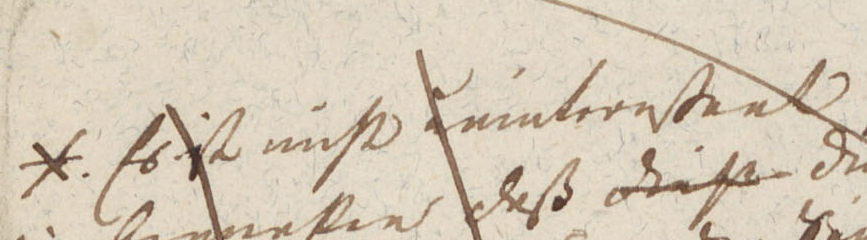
% Es ist nicht uninteressant
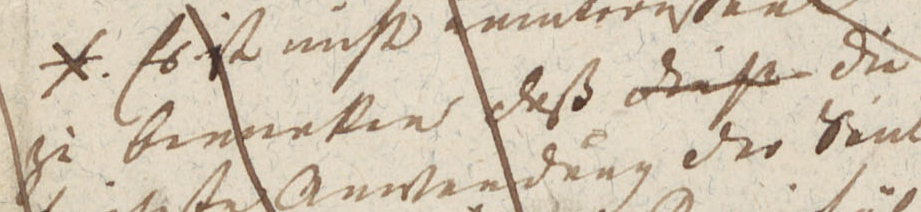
zu bemerken dass diese die
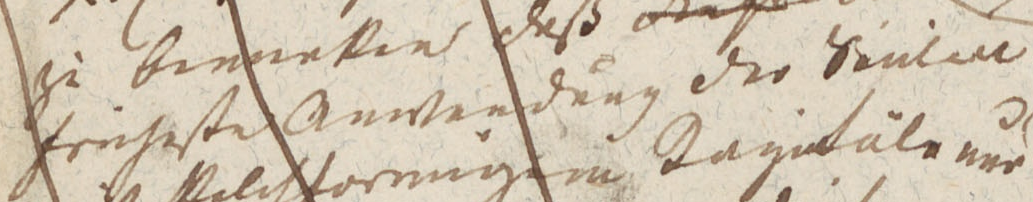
früheste Anwendung der Säulen
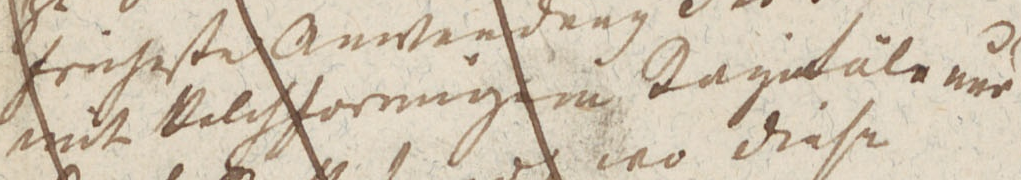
mit kelchformigem Kapitäle nur
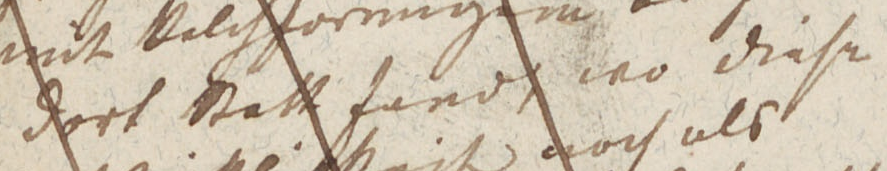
dort Statt fand, wo diese
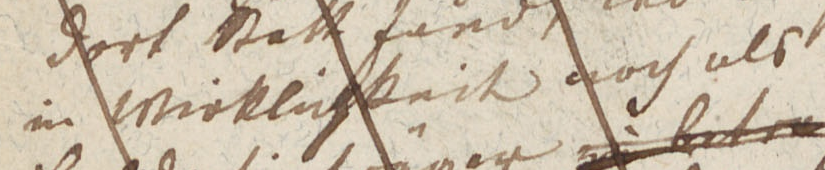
in Wirklichkeit noch als
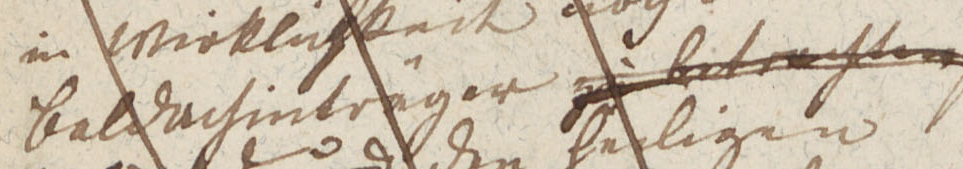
Baldachinträger zu betrachten
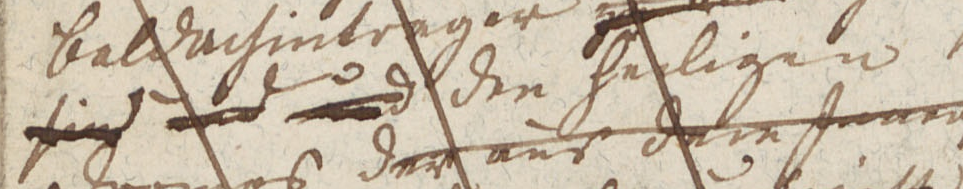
sind und und den heiligen
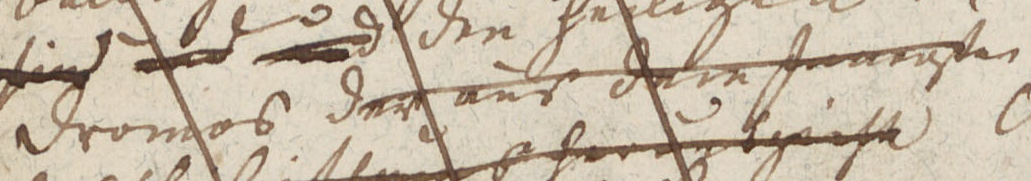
Dromos der aus dem Innersten
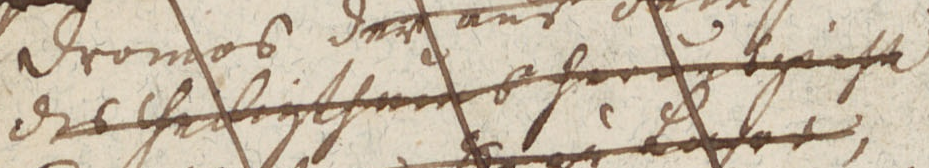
des Heiligthums herauszieht
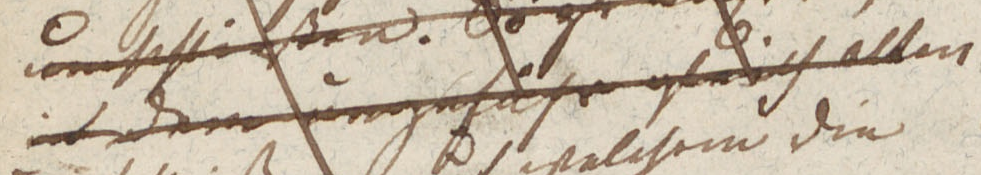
in dem ungefähr gleich allen
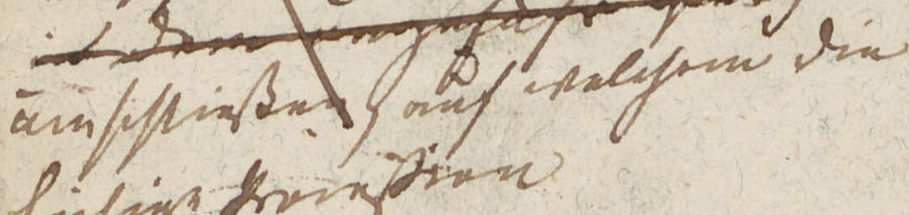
umschliessen, auf welchem die
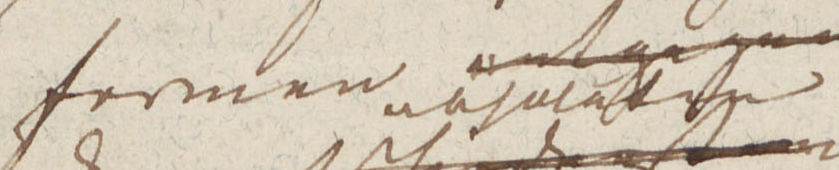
formen entgegen, wovon die
